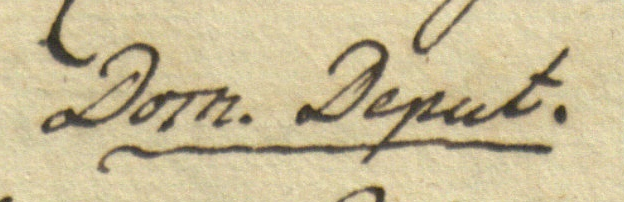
Dom. Deput.
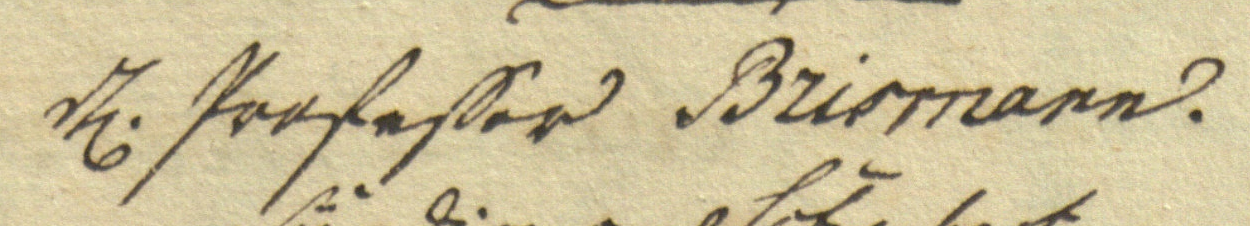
dh. Professor Brismann.
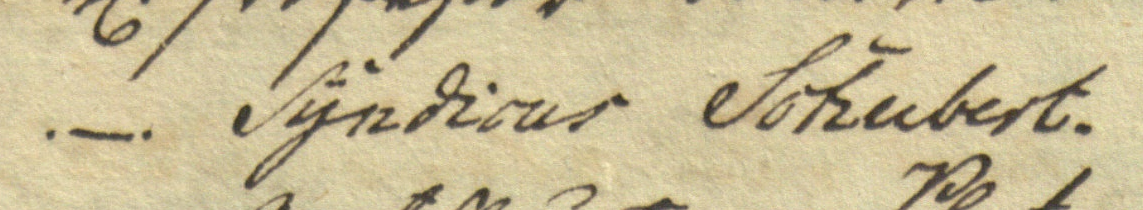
Sÿndicus Schubert.
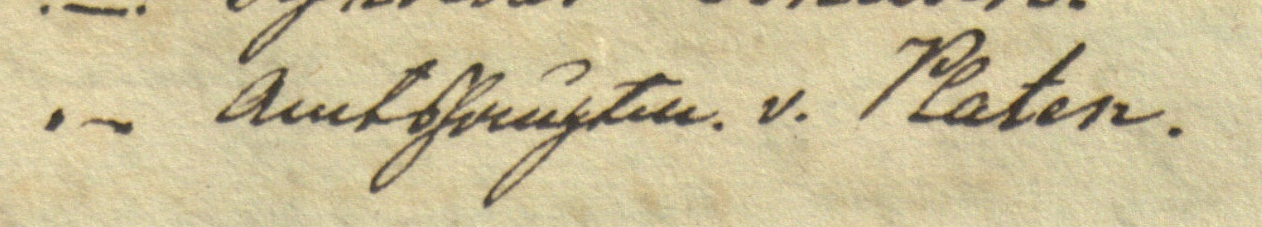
Amtshauptm. v. Platen.
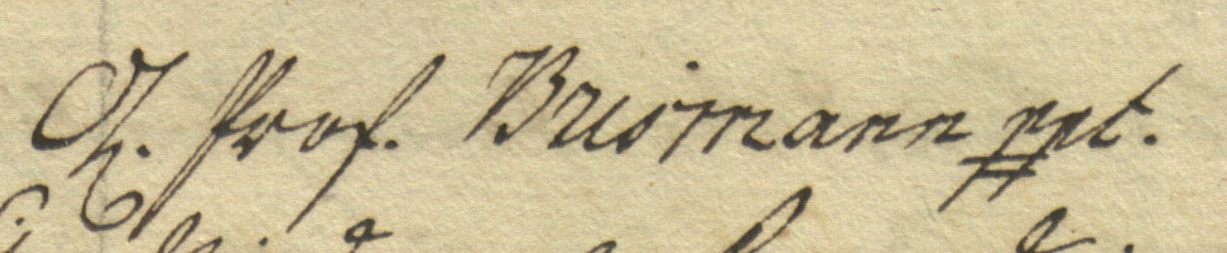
dh. Prof. Brismann ppt.
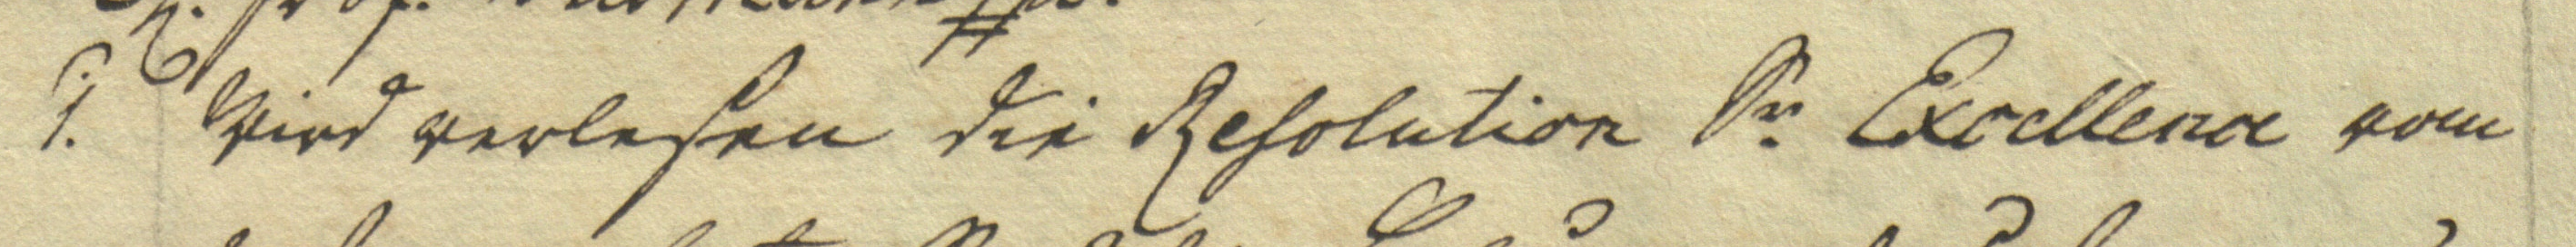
1. Wird verlesen die Resolution Sr Excellence vom
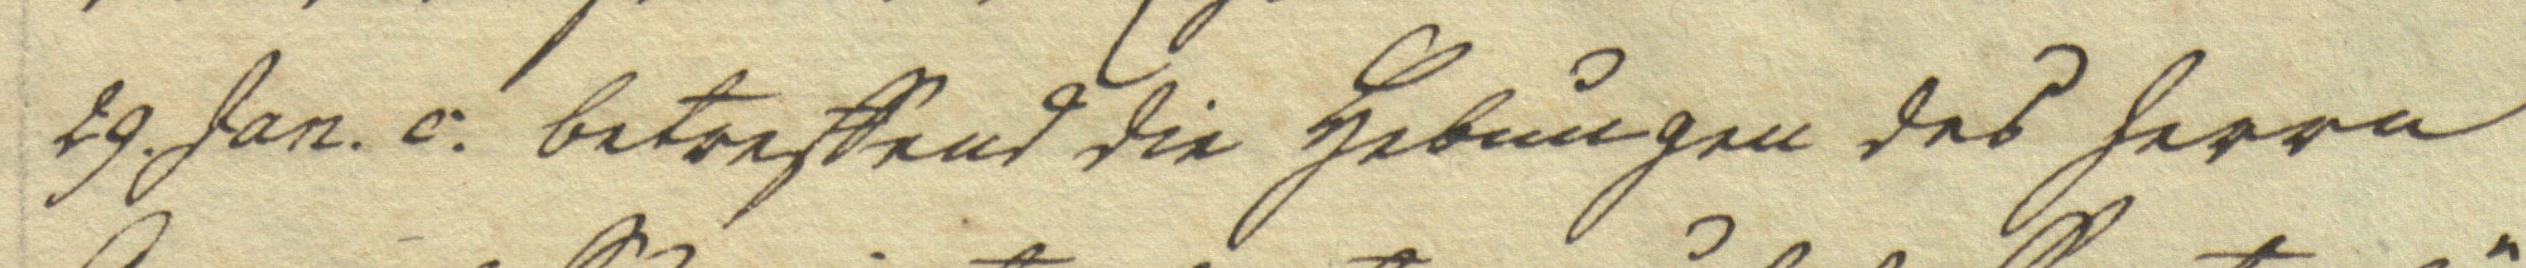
29. Jan. c. betreffend die Hebungen des Herrn
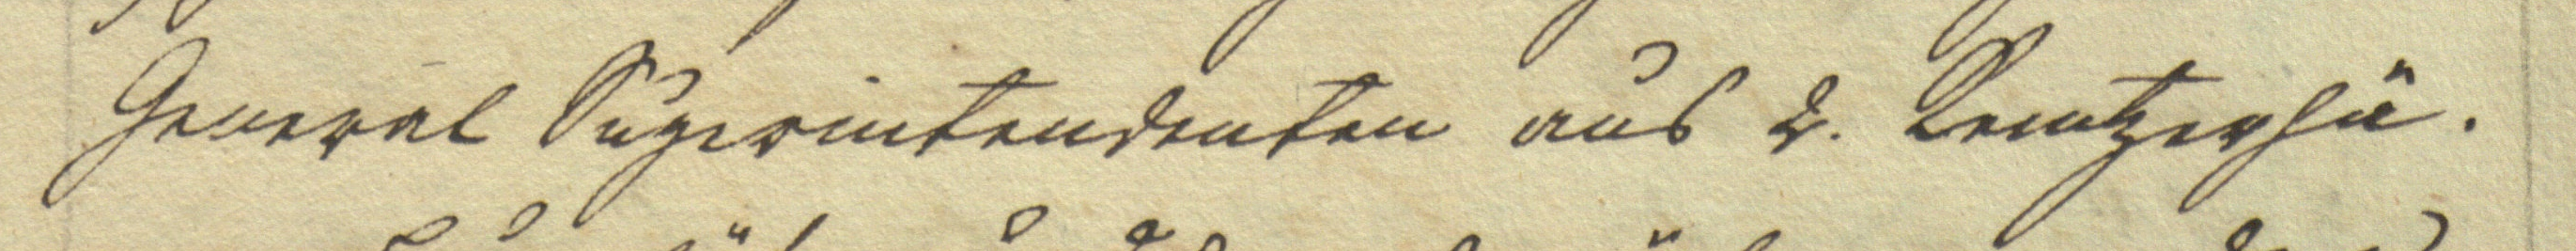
General Superintendenten aus 2. Kemtzerhä¬
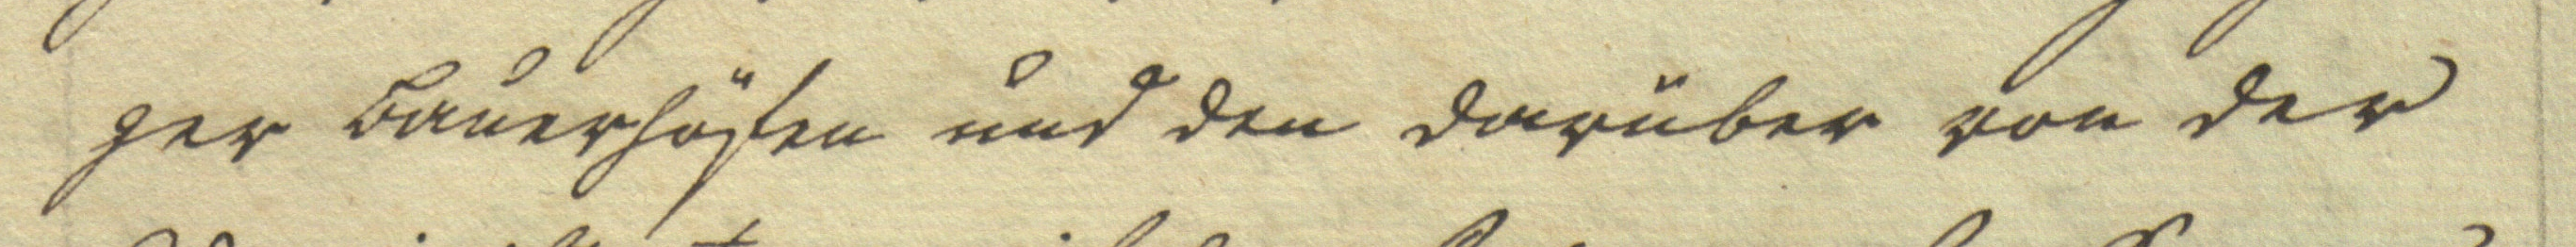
ger Bauerhöfen und den darüber von der
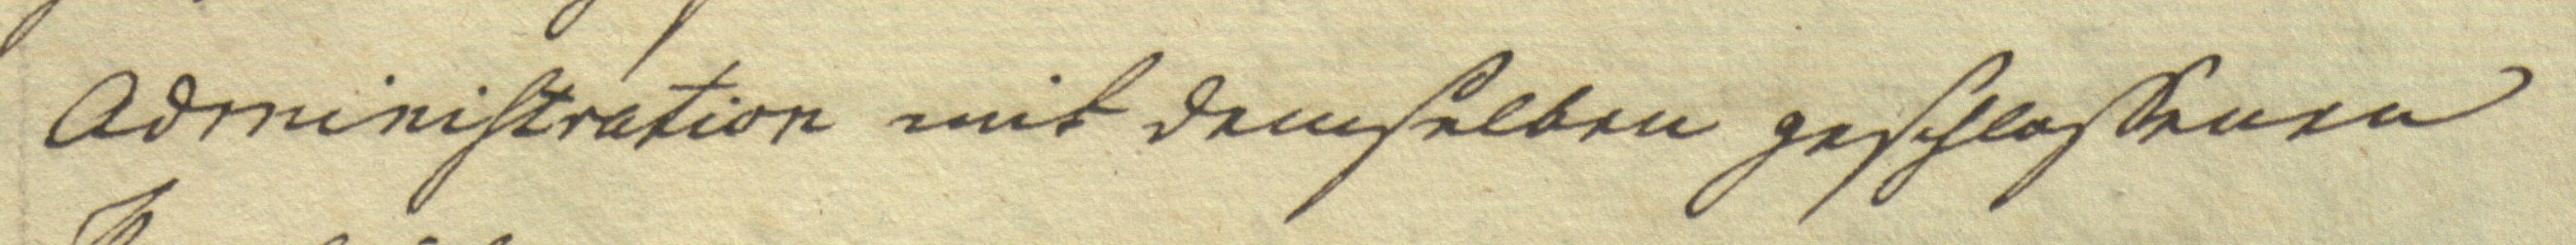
Administration mit demselben geschlossenen
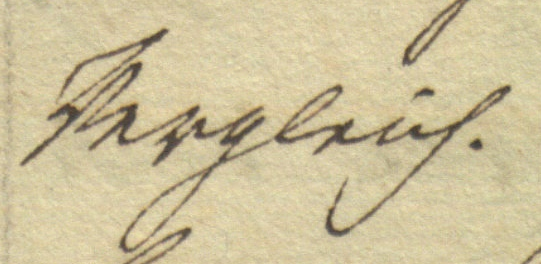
Vergleich.
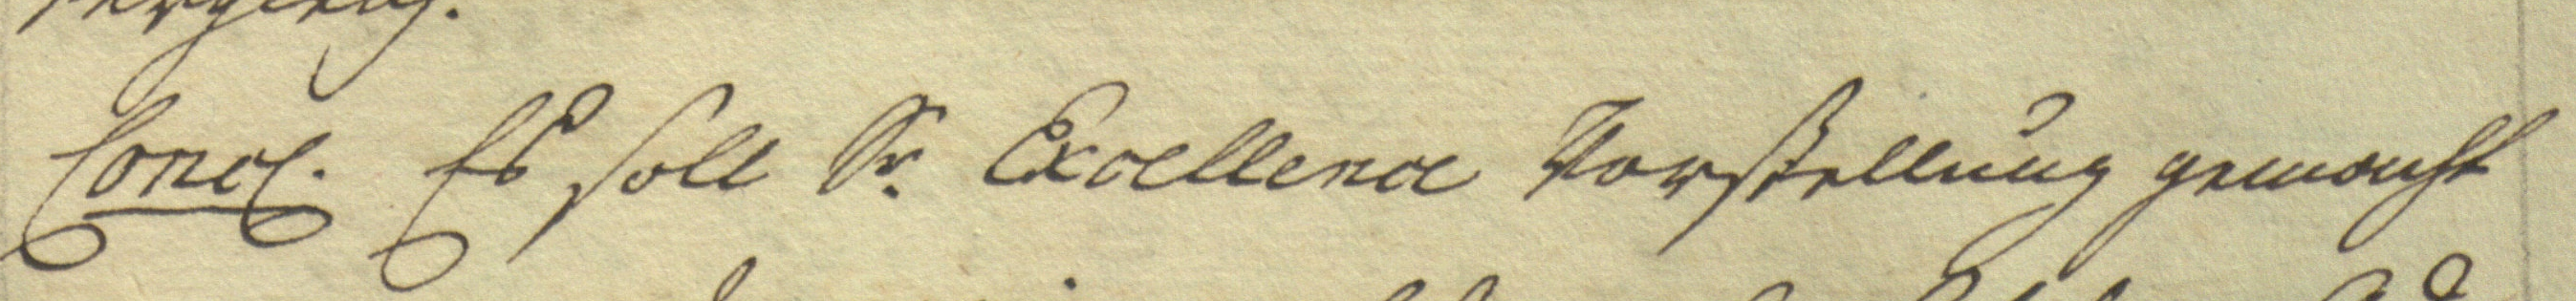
Concl. Es soll Sr Excellence Vorstellung gemacht
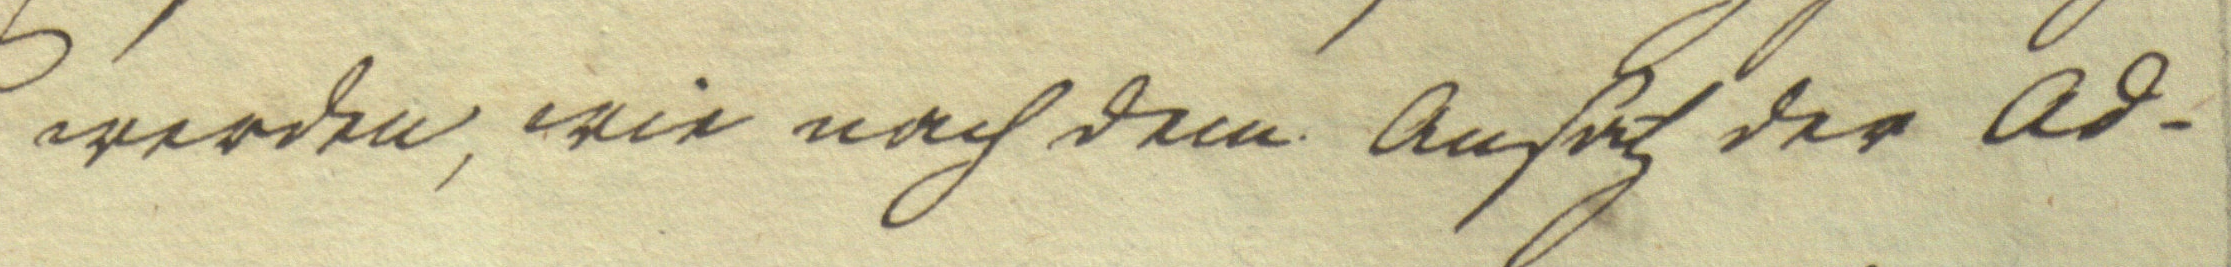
werden, wie nach dem Ansatz der Ad
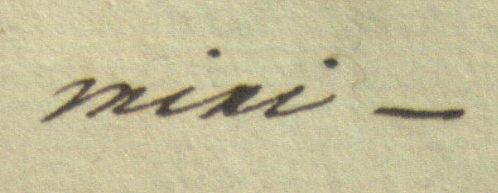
mini¬
